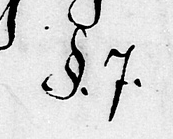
§. 7.
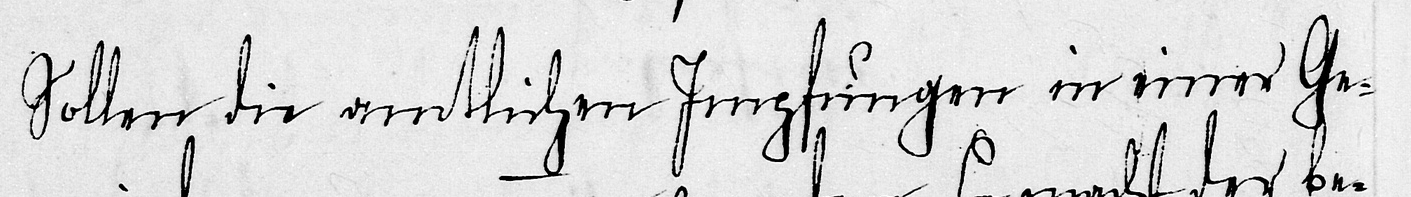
Sollen die amtlichen Impfungen in einer Ge¬
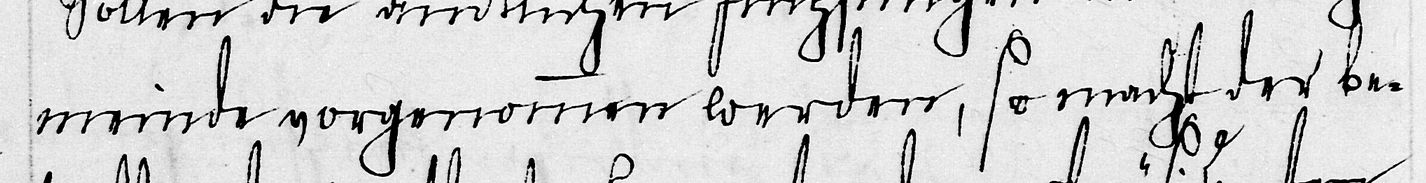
meinde vorgenommen werden, so macht der be¬
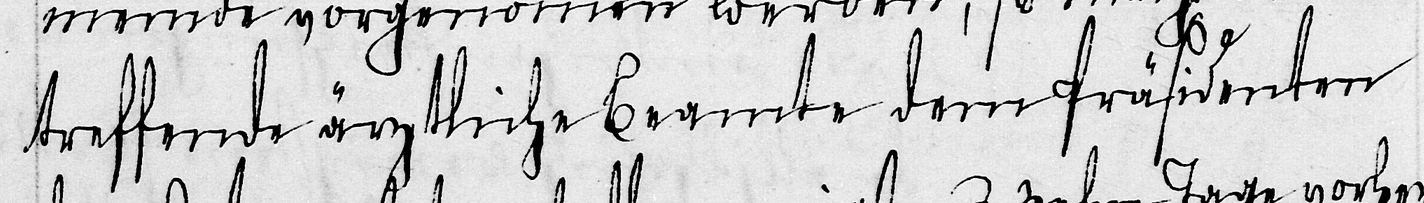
treffende ärztliche Beamte dem Präsidenten
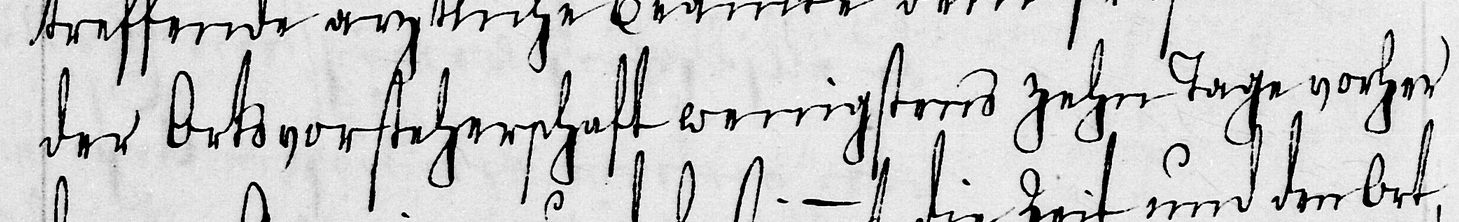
der Ortsvorsteherschaft wenigstens zehn Tage vorher
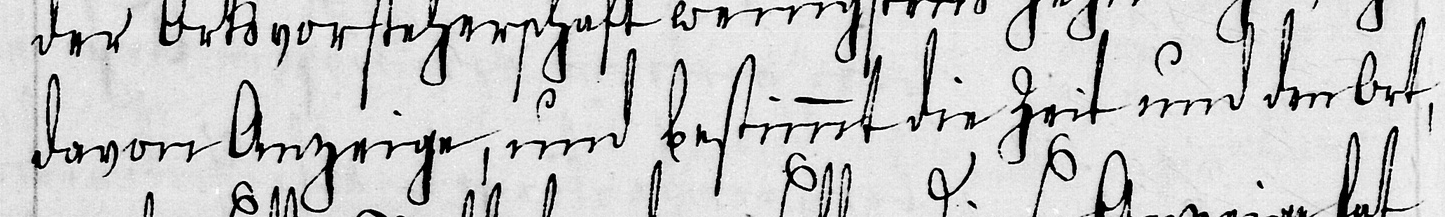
davon Anzeige, und bestimmt die Zeit und den Or¬
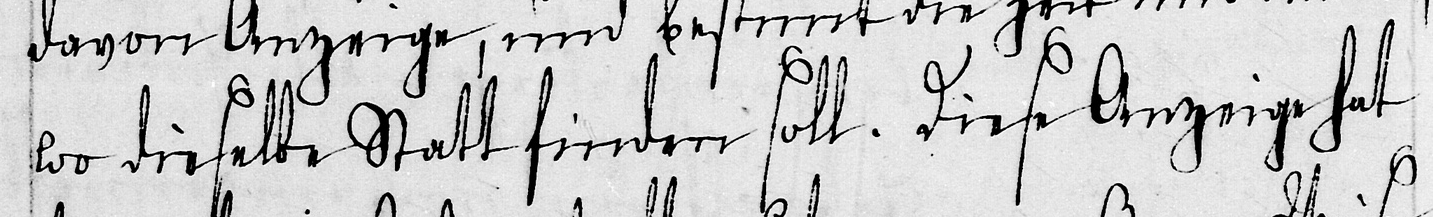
wo dieselbe Statt finden soll. Diese Anzeige hat
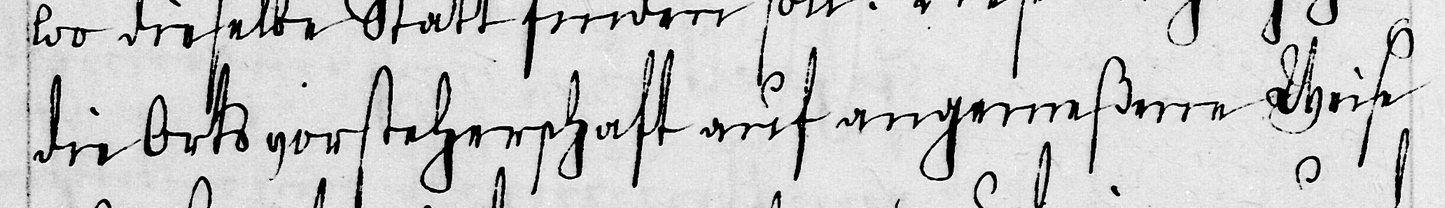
die Ortsvorsteherschaft auf angemeßene Weise
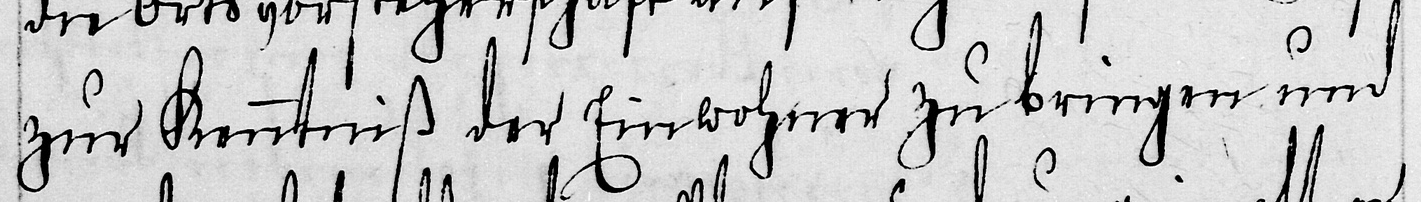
zur Kenntniß der Einwohner zu bringen und
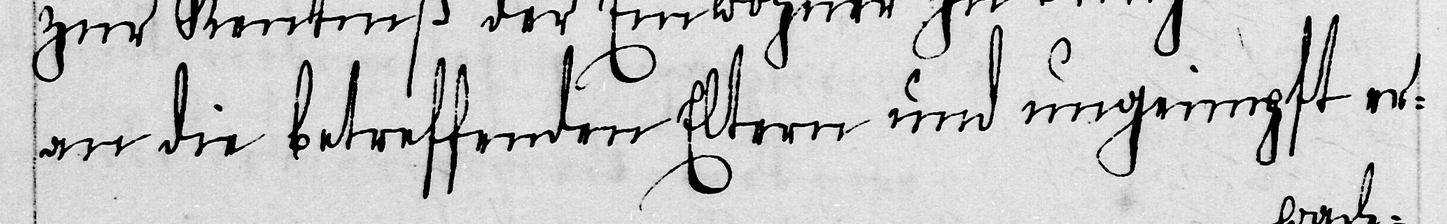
an die betreffenden Eltern und ungeimpft er-
